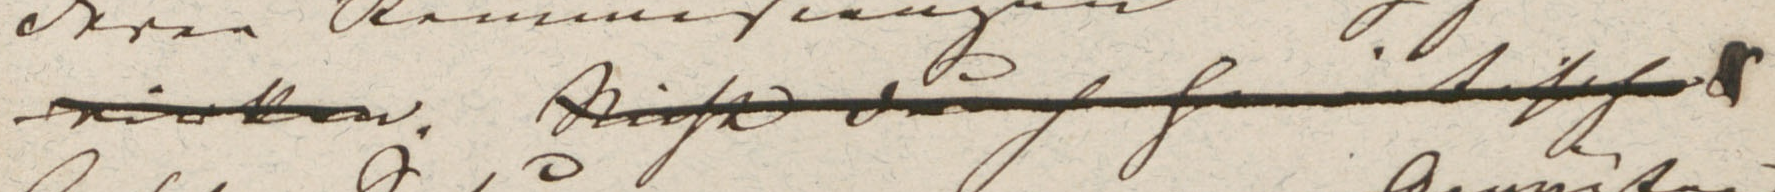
wirken. Nicht durch htisch s
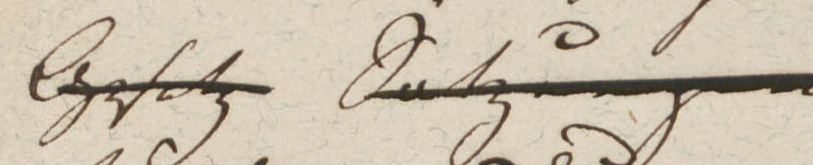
Gesetz Satzungen,
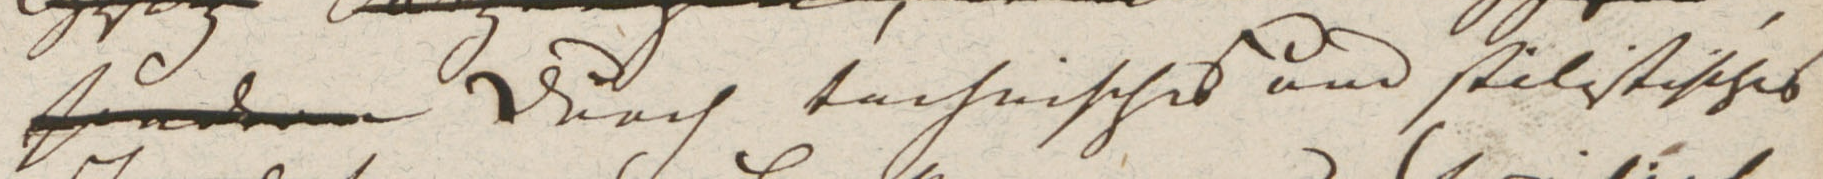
sondern dDurch technisches und stilistisches
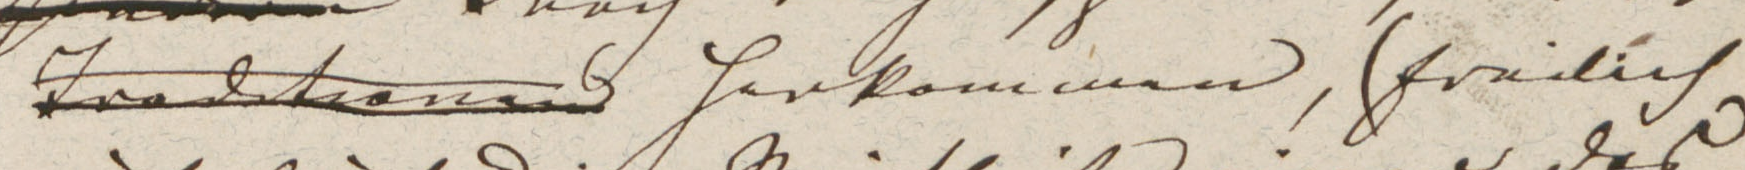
Traditionen Herkommen, (freilich
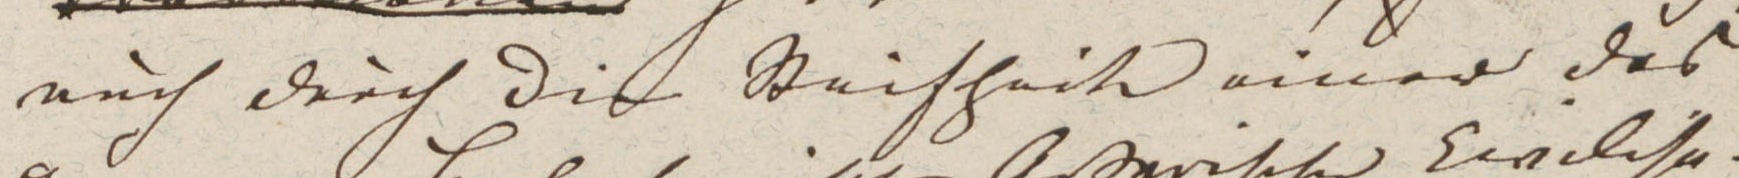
auch durch die Steifheit einer das
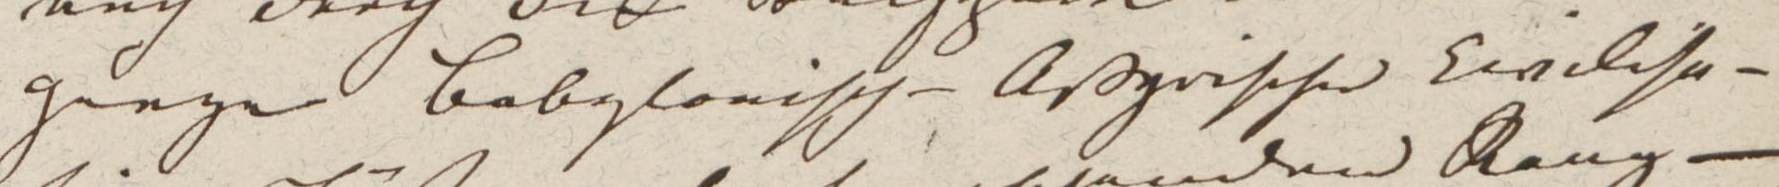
ganze Babylonisch-Assyrische Civilisa-
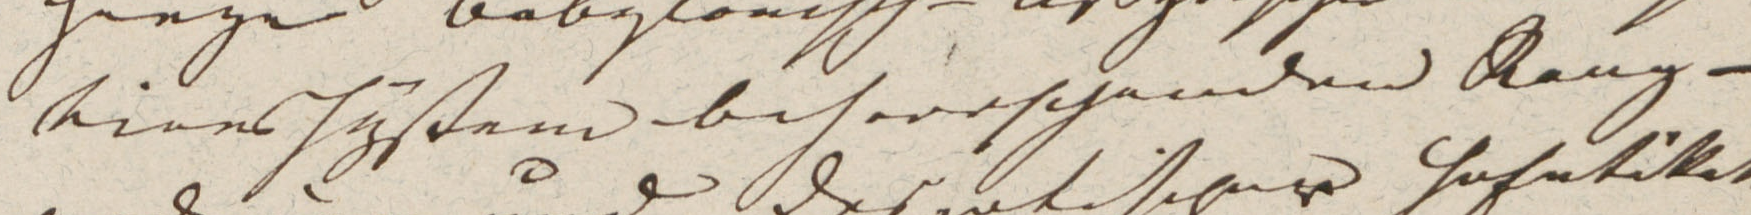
tionssystem beherrschenden Rang-
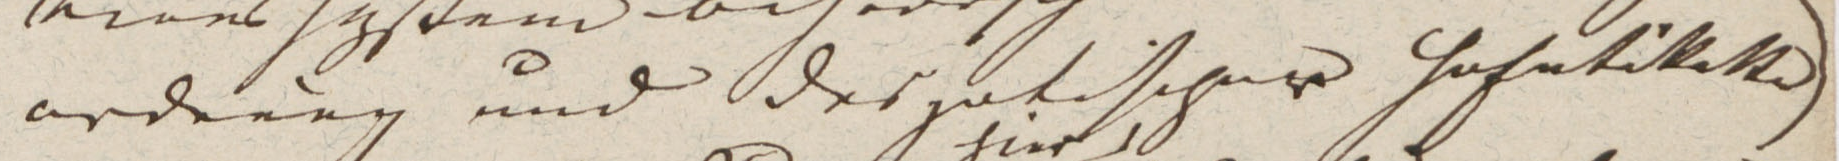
ordnung und despotischenr Hofetikette)
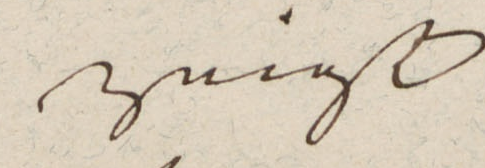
zeigt
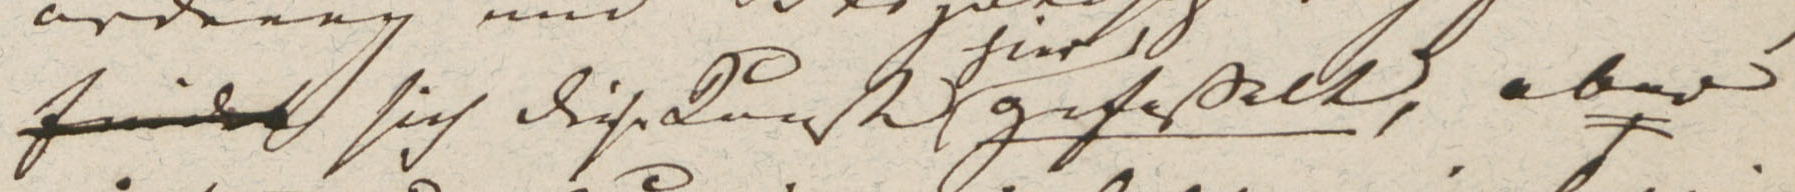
findet sich diese Kunst hier gefesselt, aber
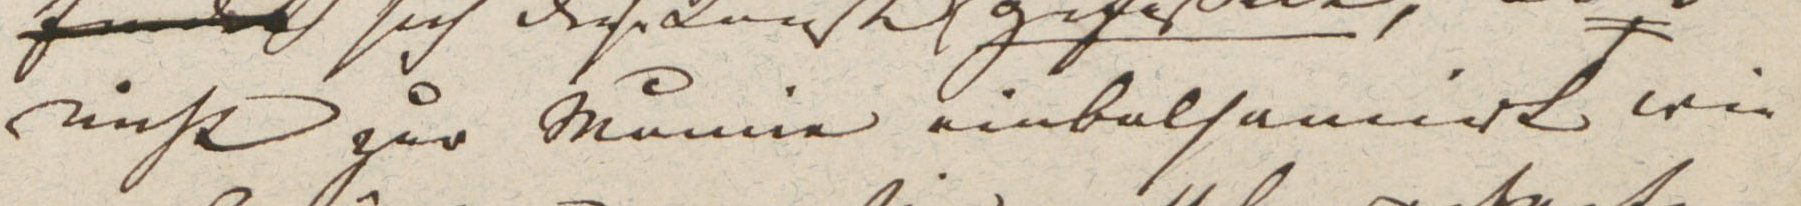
nicht zur Mumie einbalsamirt % wie
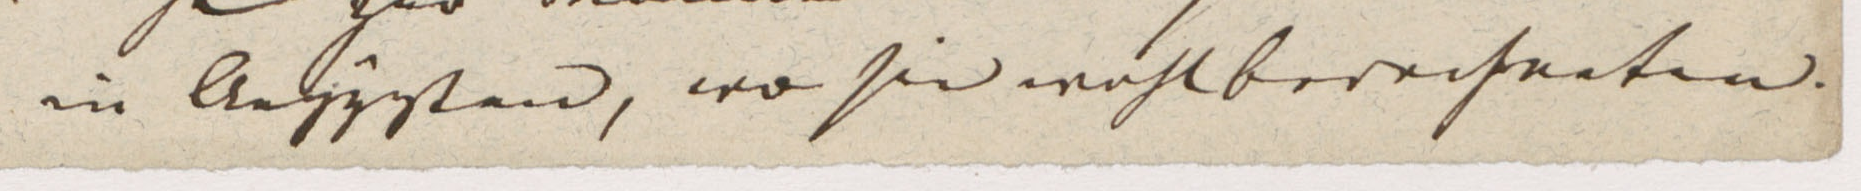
in Aegypten, wo sie wohl berechneten.
